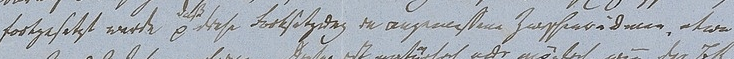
fortgesetzt werde & daß diese Fortsetzung in angemessene Zwischenräumen, etwa
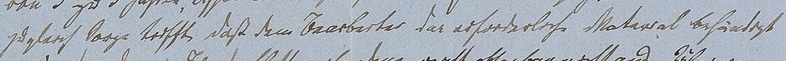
zugleich Sorge trifft, daß dem Bearbeiter das erforderliche Material behändigt
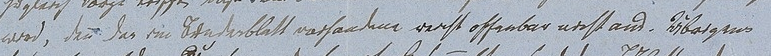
wird, denn das im Bundesblatt vorhandene reicht offenbar nicht aus. Übrigens
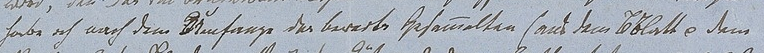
habe ich auch dem Umfange des bereits Gesammelten (aus dem BBlatt & dem
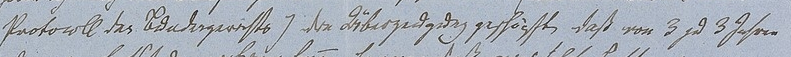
Protocoll des Bundesgerichts) die Überzeugung geschöpft, daß von 3 zu 3 Jahren
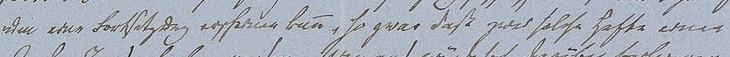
nun eine Fortsetzung erscheinen kann, so zwar daß zwei solche Hefte einen
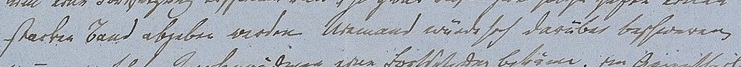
starken Band abgeben werden. Niemand würde sich darüber beschweren,
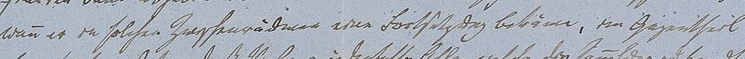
wenn er in solchen Zwischenräumen eine Fortsetzung bekäme, im Gegentheil
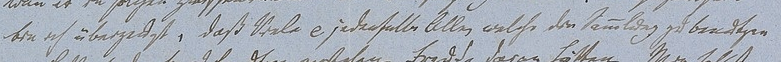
bin ich überzeugt, daß Viele & jedenfalls Alle, welche die Sammlung zu benutzen
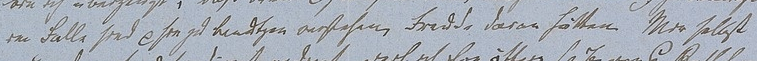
im Falle sind & sie zu benutzen verstehen, Freude daran hätten. Mir selbst
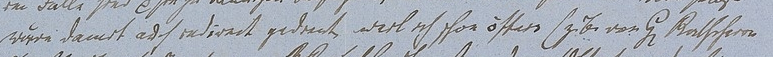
wäre damit auch indirect gedient, weil ich schon öfters (z. B. von Hrn Rathsherrn
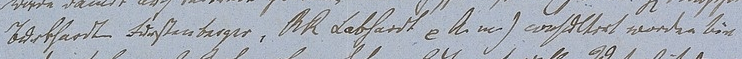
Burkhardt Fürstenberger, RR Labhardt uA. m.) consultirt worden bin
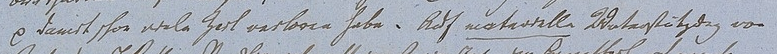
& damit schon viele Zeit verloren habe. Auf materielle Unterstützung von
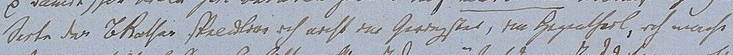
Seite des BRathes speculire ich nicht im Geringsten, im Gegentheil, ich mache
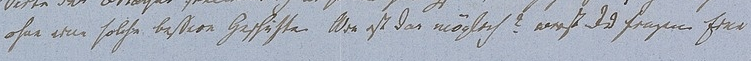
ohne eine solche bessere Geschäfte. Wie ist das möglich? wirst Du fragen. Eine
